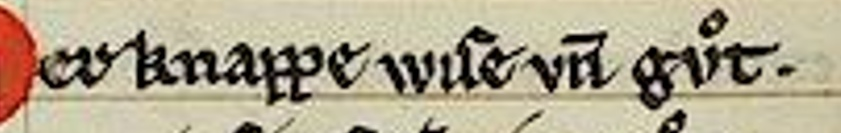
*Der knappe wiſe vn(d) gv°ot.
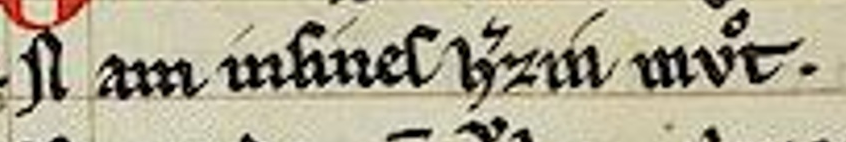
Nam inſineſ h(er)zin mv°ot.
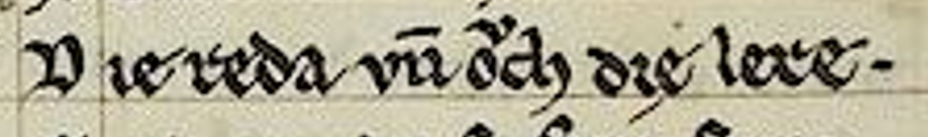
Die reda vn(d) o°vch die lere.
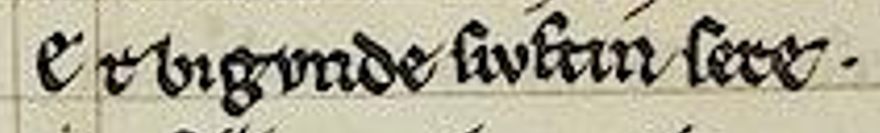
Er bigvnde ſivftin ſere.
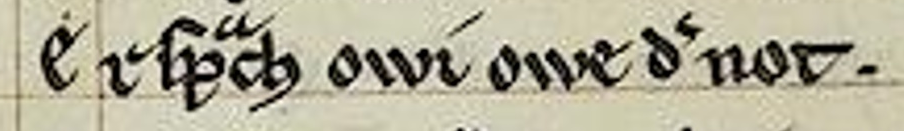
Er ſp(ra)ch owi owe d(er) not.
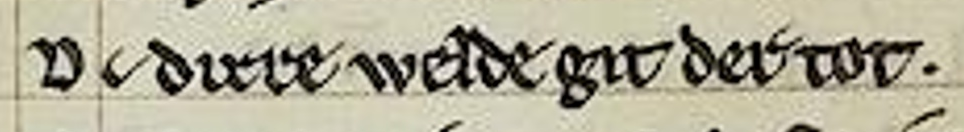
D(az) dirre welde git der tot.
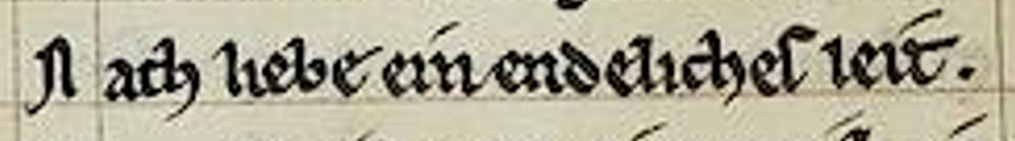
Nach liebe ein endelicheſ leit.
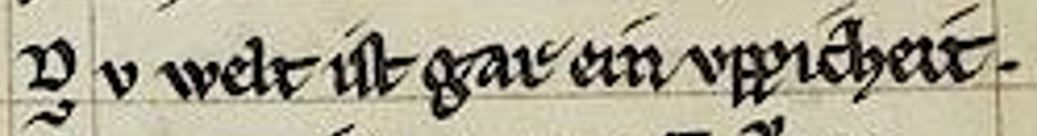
Dv welt iVt gar ein vppicheit.
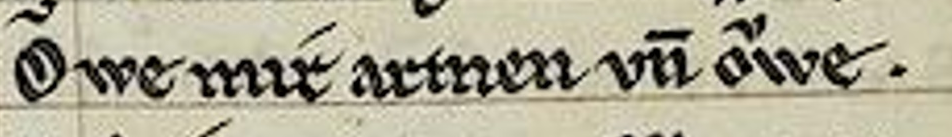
O°vwe mir armen vn(d) o°vwe.
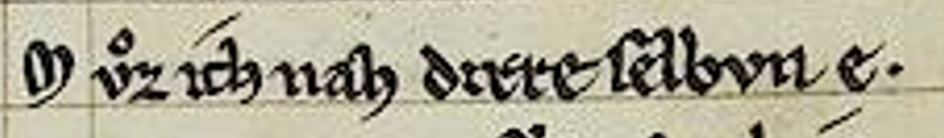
Mv°oz ich nah dirre ſelbvn e.
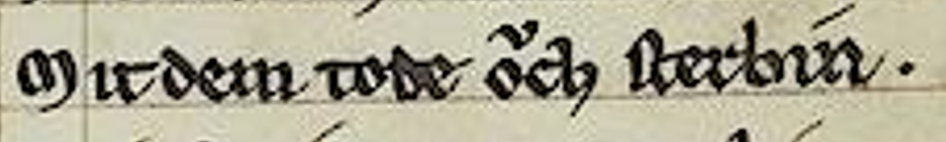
Mit dem tode o°vch ſterbin.
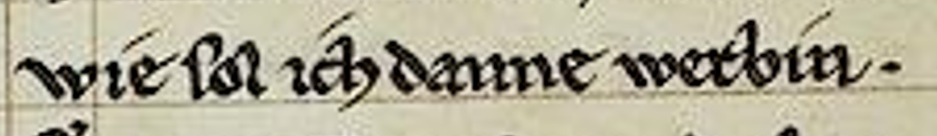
Wie ſol ich danne werbin.
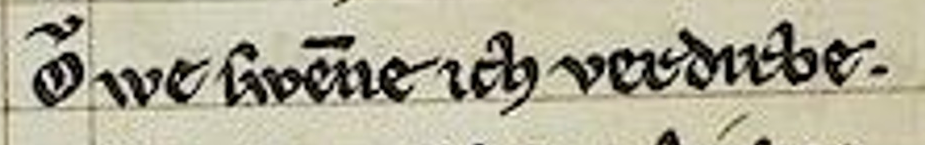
O°vwe ſwe(n)ne ich verdirbe.
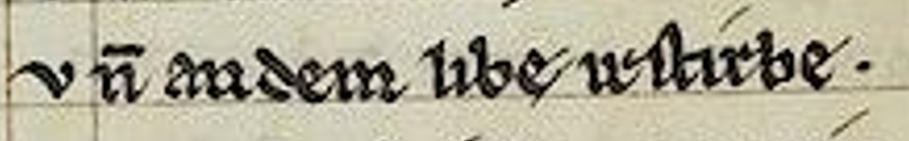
Vn(d) an dem libe irſtirbe.
